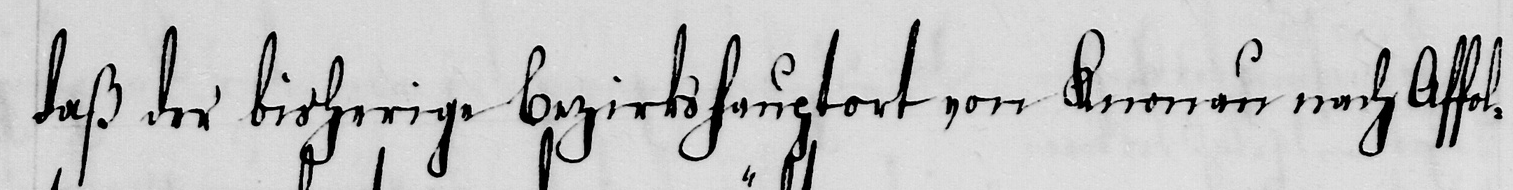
daß der bisherige Bezirkshauptort von Knonau nach Affo¬
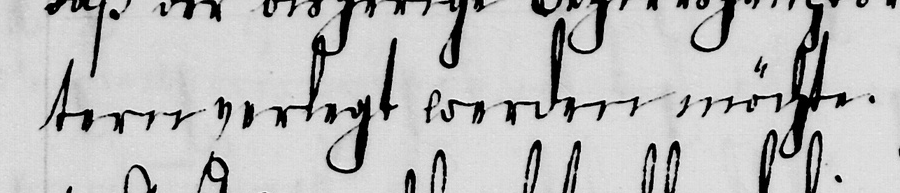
ltern verlegt werden möchte.
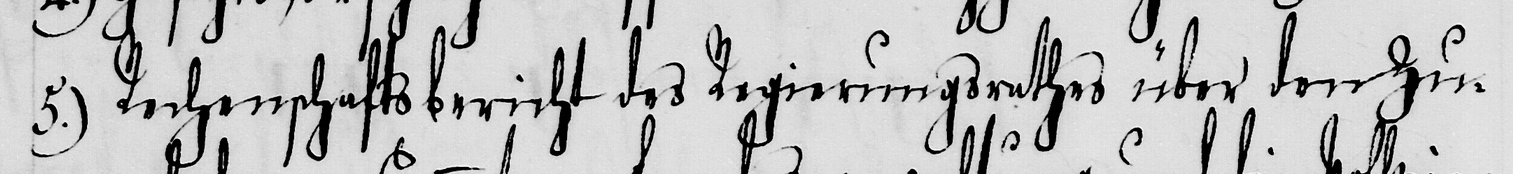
5.) Rechenschaftsbericht des Regierungsrathes über den Zu¬
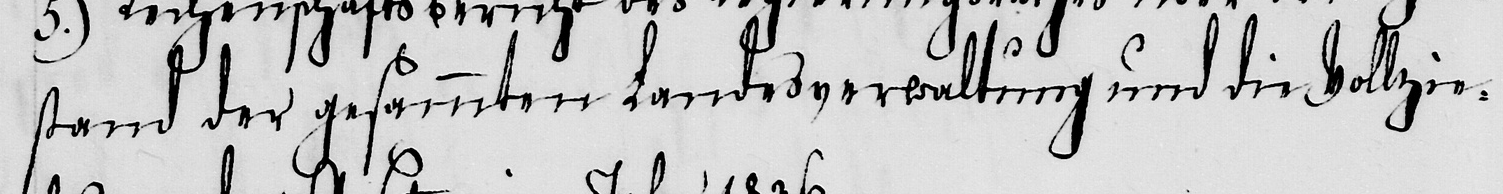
stand der gesammten Landesverwaltung und die Vollzie¬
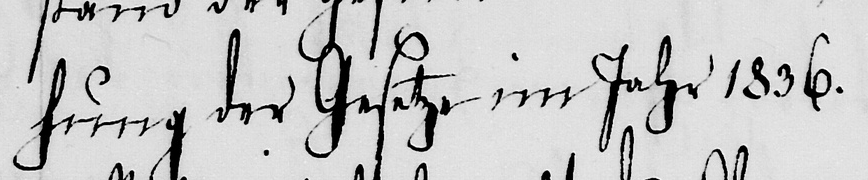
hung der Gesetze im Jahr 1836.
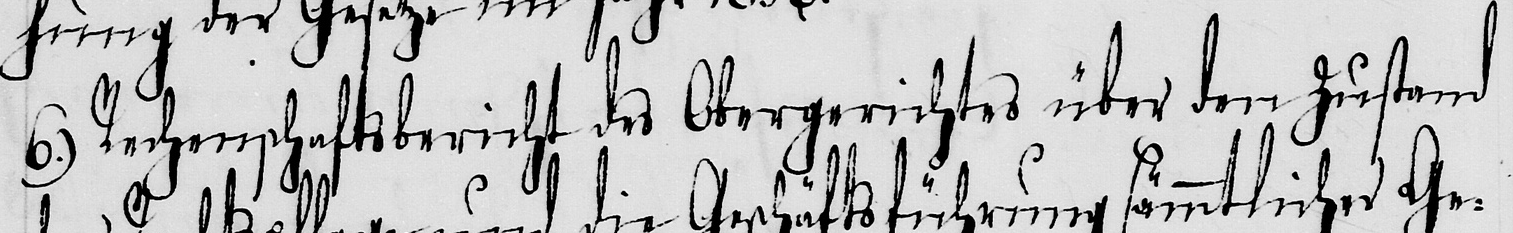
6.) Rechenschaftsbericht des Obergerichtes über den Zustand
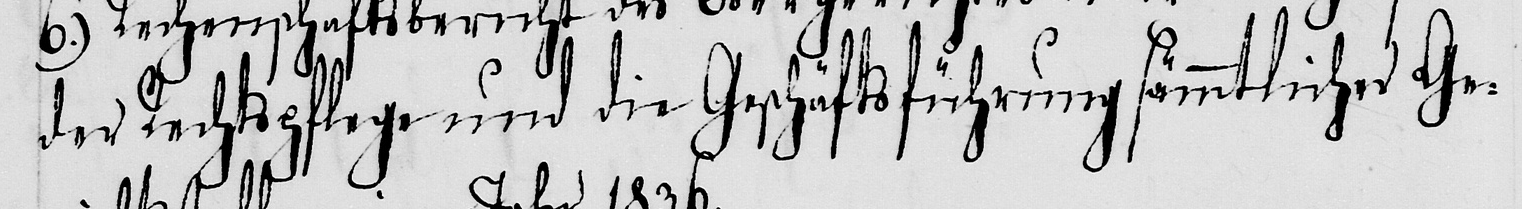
der Rechtspflege und die Geschäftsführung sämmtlicher Ge¬
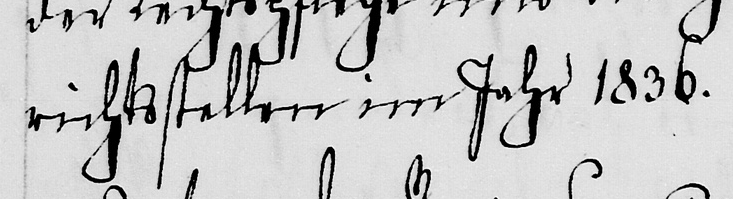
richtsstellen im Jahr 1836.
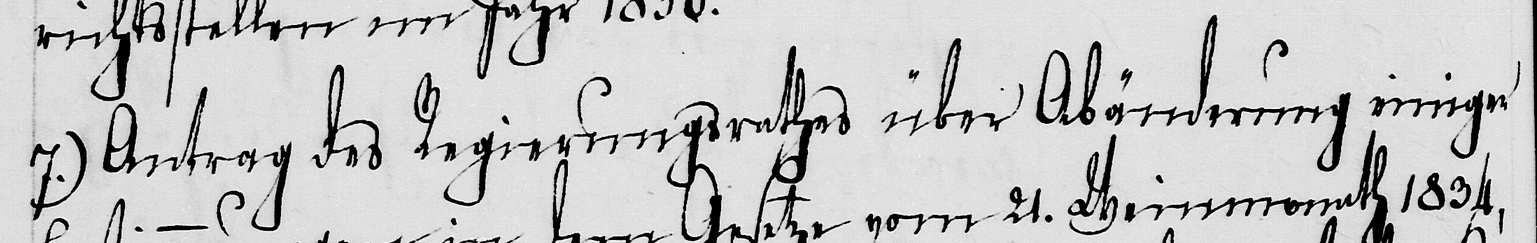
7.) Antrag des Regierungsrathes über Abänderung einiger
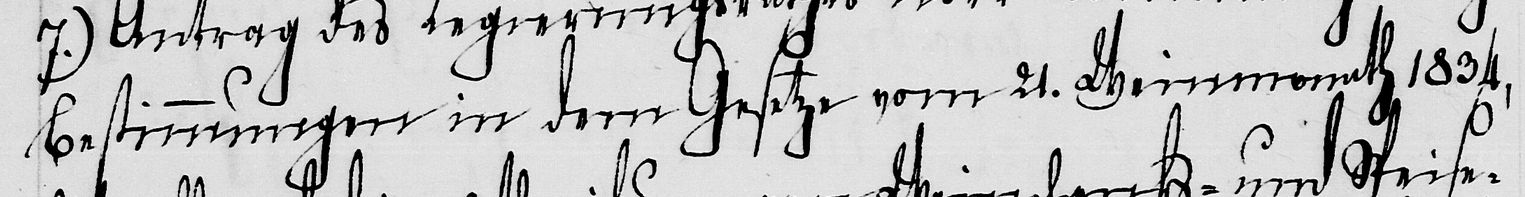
Bestimmungen in dem Gesetze vom 21. Weinmonath 1834,
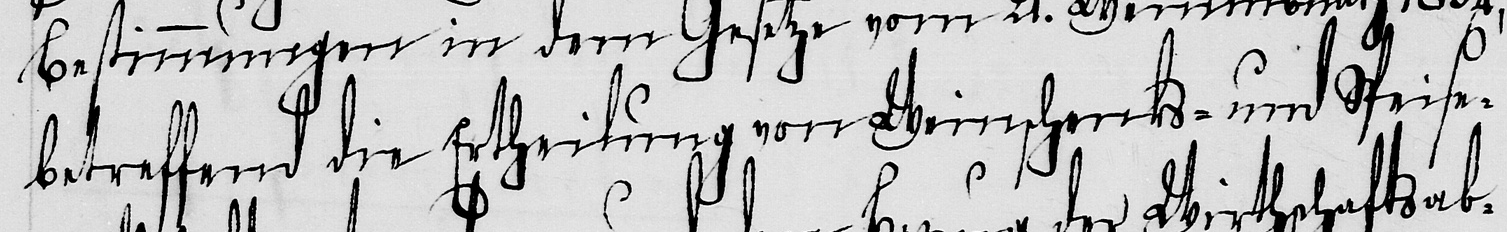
betreffend die Ertheilung von Weinschenks- und Speise¬
